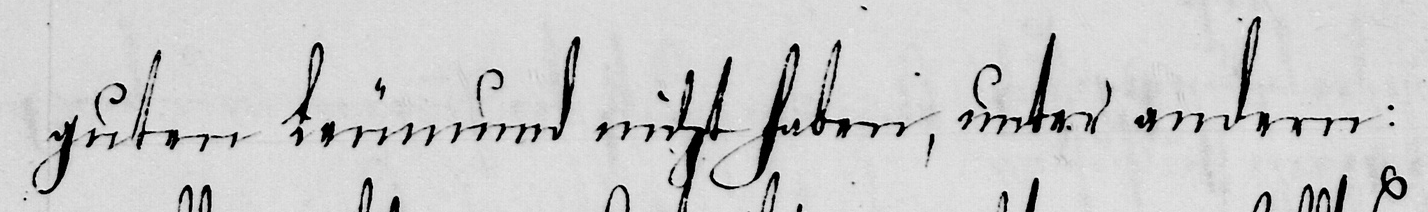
guten Leumund nicht haben, unter andern:
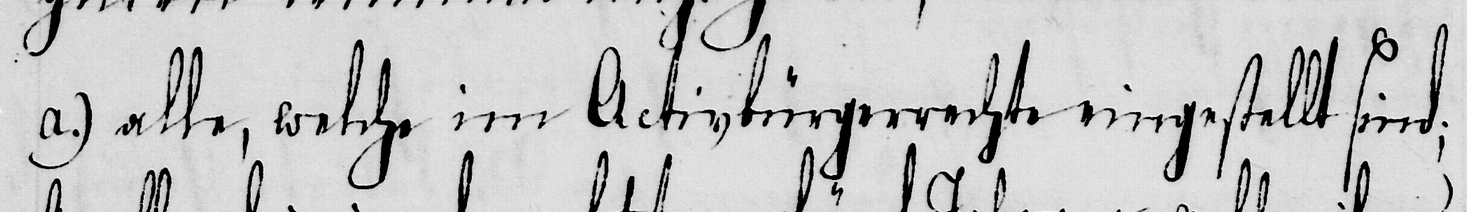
a.) alle, welche im Activbürgerrechte eingestellt sin¬
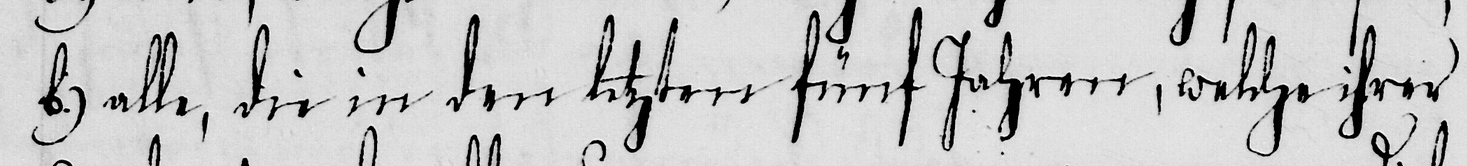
b.) alle, die in den letzten fünf Jahren, welche ihrer
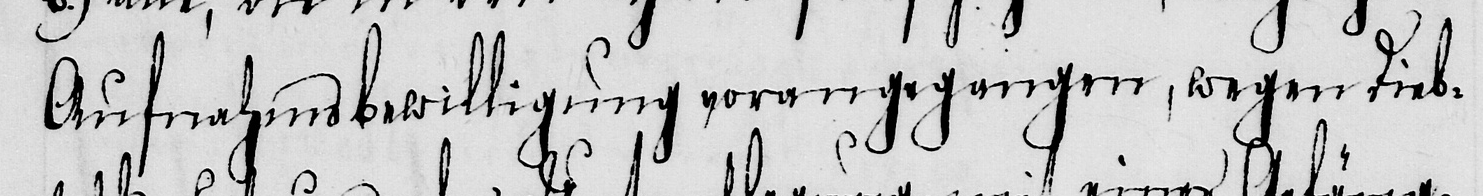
Aufnahmsbewilligung vorangegangen, wegen Dieb¬
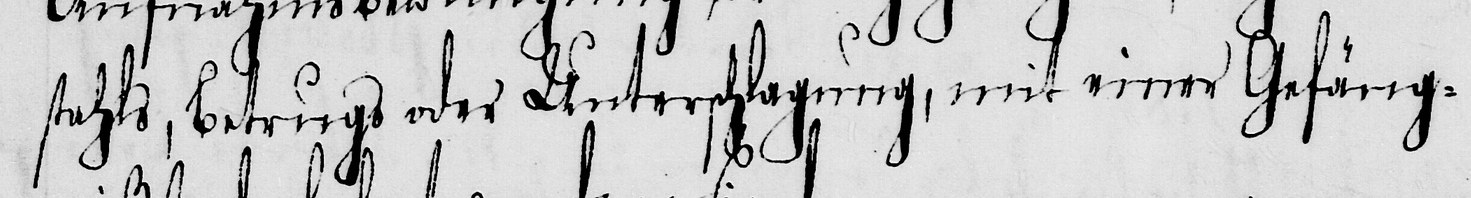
stahls, Betrugs oder Unterschlagung, mit einer Gefäng¬
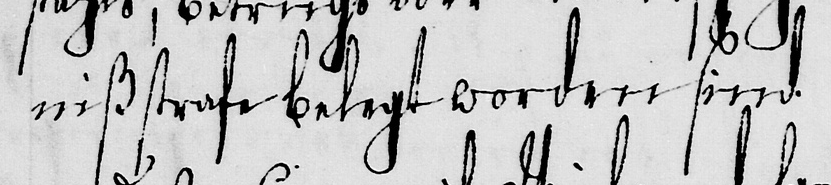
nißstrafe belegt worden sind.
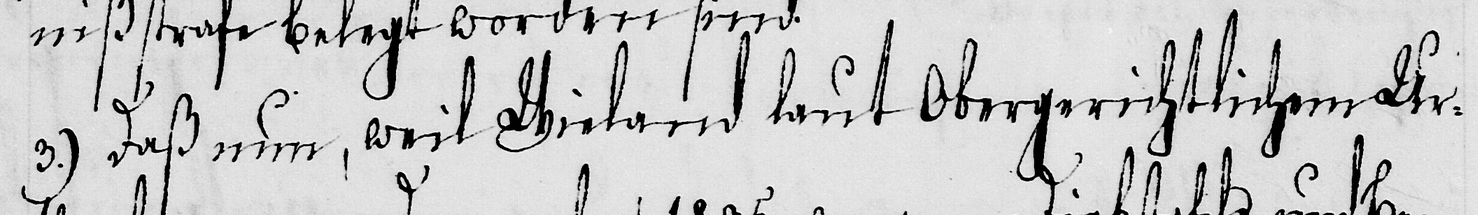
3.) Daß nun, weil Wieland laut Obergerichtlichem Ur¬
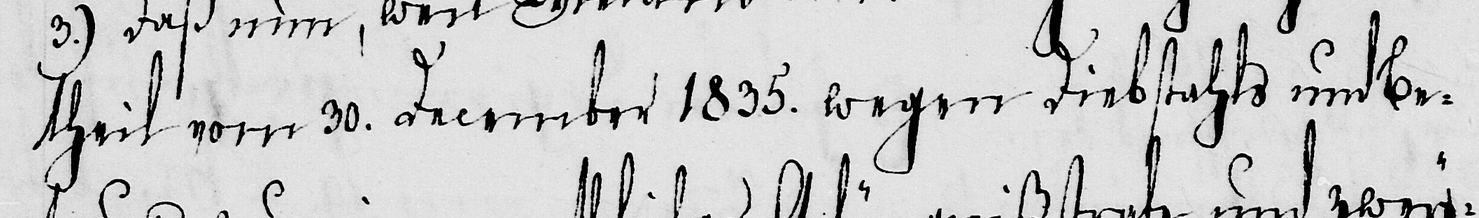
theil vom 30. December 1835. wegen Diebstahls und Be¬
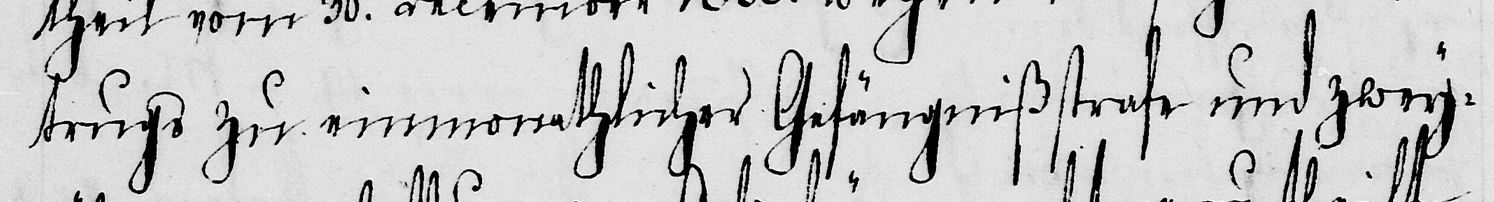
trugs zu einmonathlicher Gefängnißstrafe und zwey¬
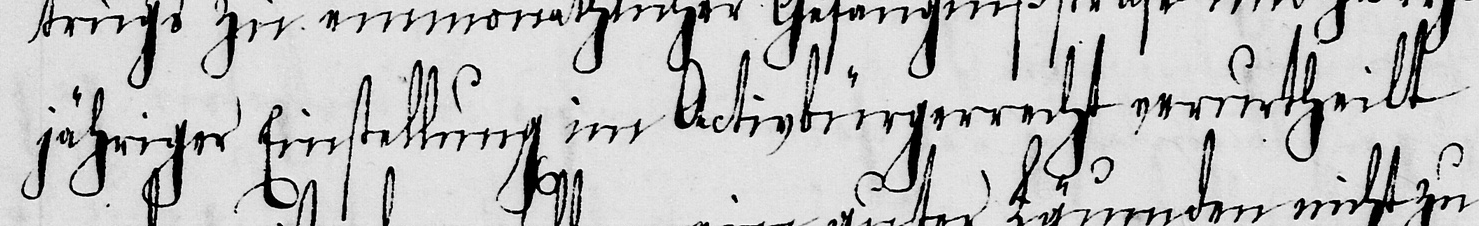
jähriger Einstellung im Activbürgerrecht verurtheilt
